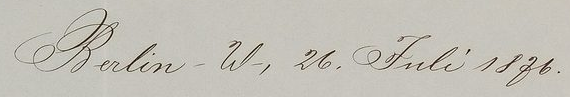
Berlin -W -, 26. Juli 1876
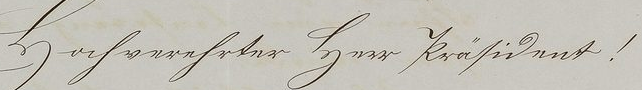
Hochverehrter Herr Präsident!
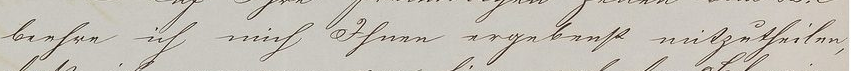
beehre ich mich Ihnen ergebenst mitzutheilen,
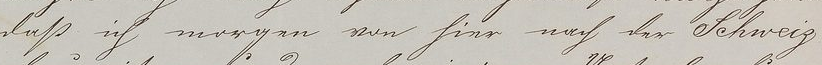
daß ich morgen von hier nach der Schweiz
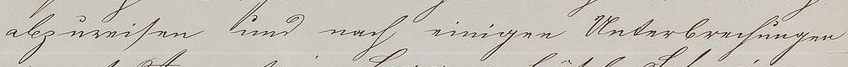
abzureisen und nach einigen Unterbrechungen
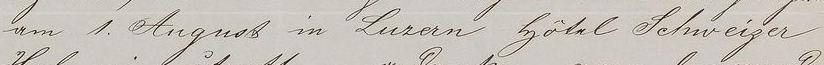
am 1. August in Luzern Hôtel Schweizer
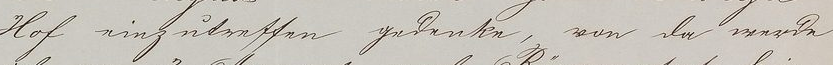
Hof einzutreffen gedenke, von da werde
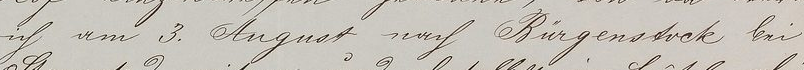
ich am 3. August nach Bürgenstock bei
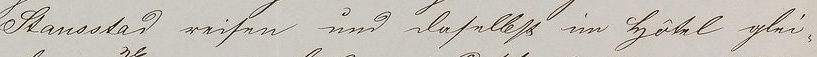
Stansstad reisen und daselbst im Hôtel glei-
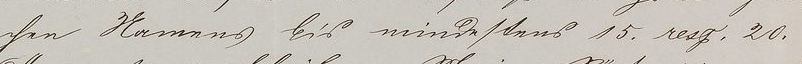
chen Namens bis mindestens 15. resp. 20.
